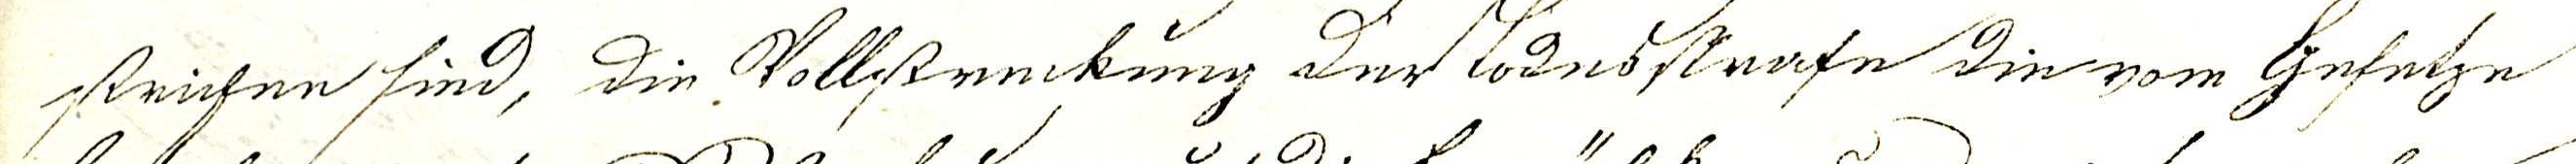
strichen sind, die Vollstreckung der Todesstrafe die vom Gesetze
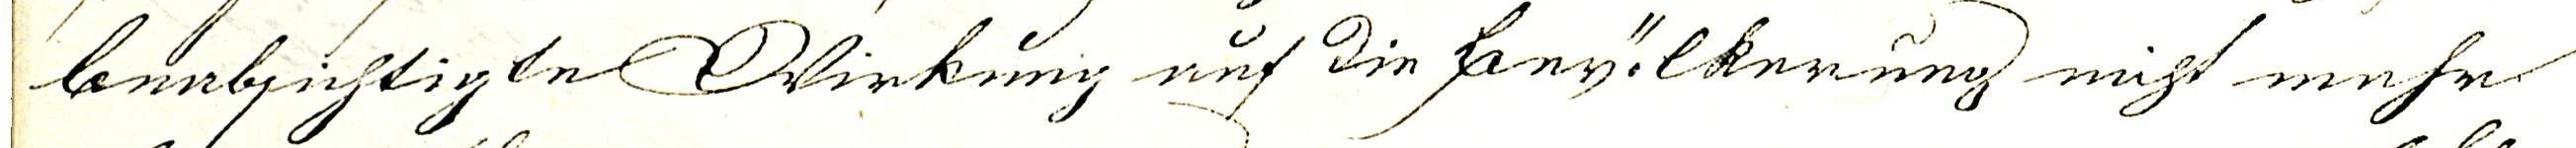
beabsichtigte Wirkung auf die Bevölkerung nicht mehr
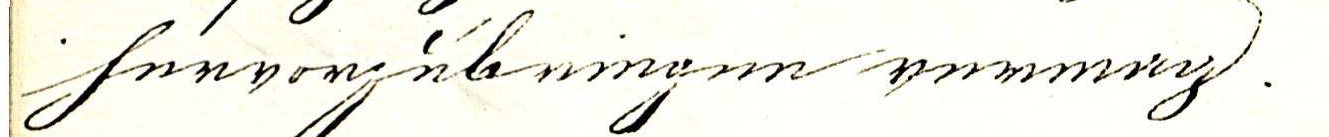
hervorzubringen vermag.
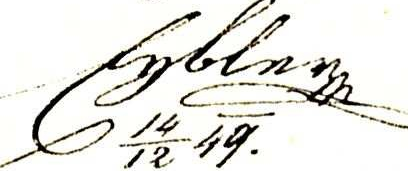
Ezbler
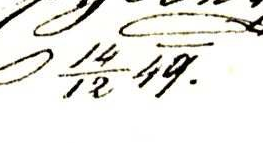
14/12 49.
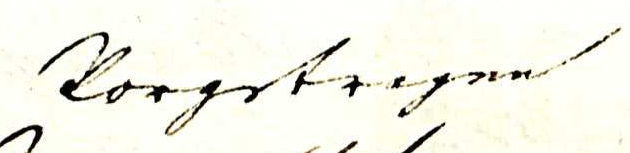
Vorgetragen
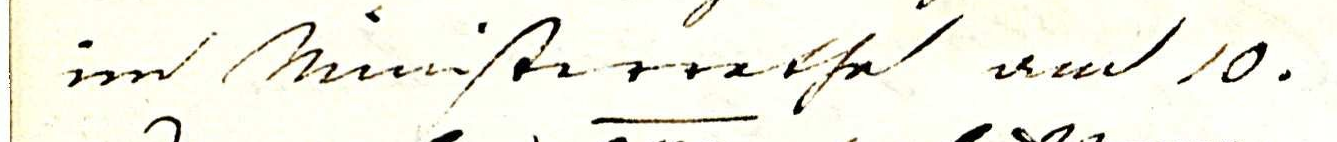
im Ministerrathe am 10.
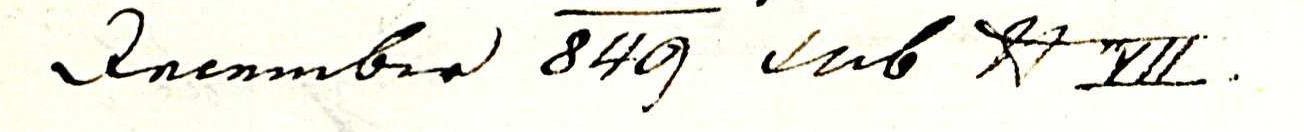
Dezember 849 sub xx VII.
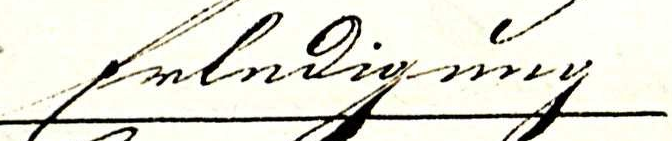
Erledigung
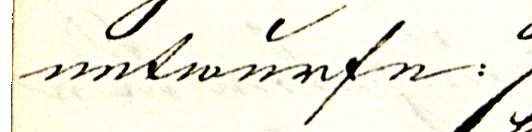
entwurfe:
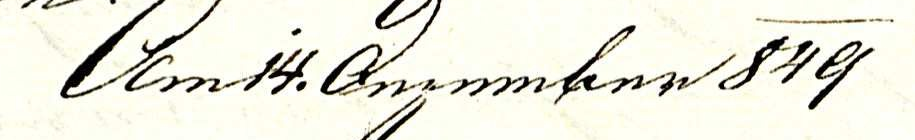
Am 14. Dezember 849
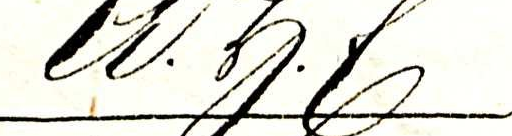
A. H. E
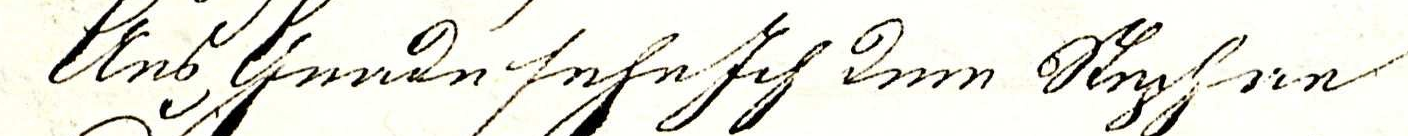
Aus Gnade sehe Jch dem Stephan
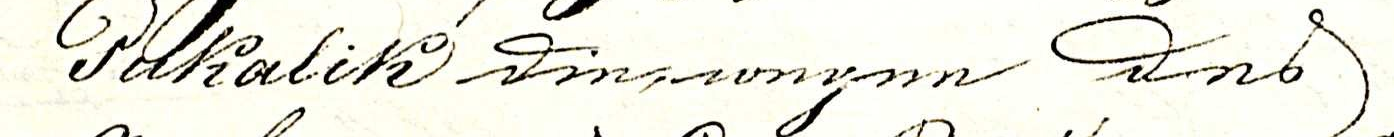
Pukalik die, wegen des
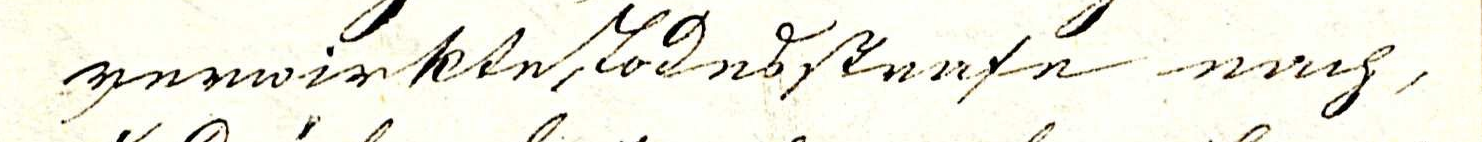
verwirkte, Todesstrafe nach,
